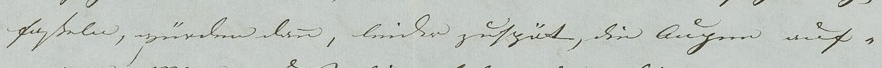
faßeln, würden dann, leider zuspät, die Augen auf-
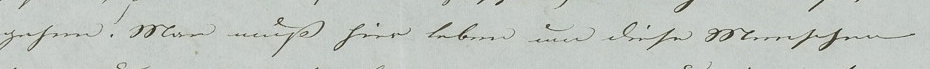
gehen! Man muß hier leben um diese Menschen
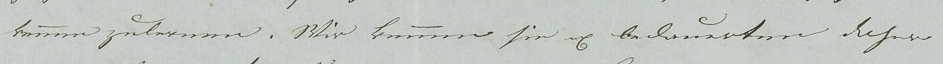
kennen zulernen. Wir kennen sie & bedauerten daher
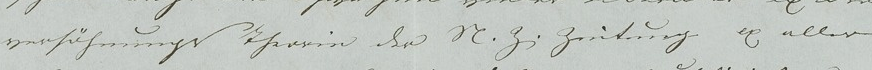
versöhnungs Theorie der N. Z. Zeitung & aller
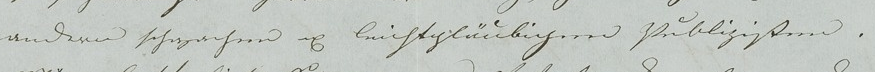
andern schwachen & leichtgläubigen Publizisten.
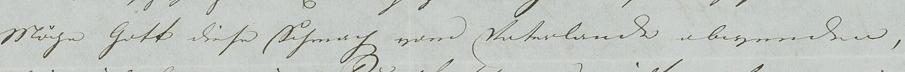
Möge Gott diese Schmach vom Vaterlande abwenden,
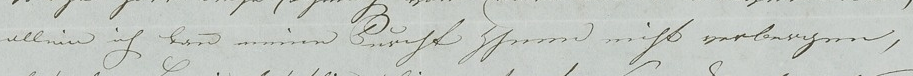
allein ich kann meine Furcht Ihnen nicht verbergen,
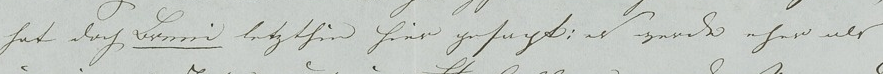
hat doch Breni letzthin hier gesagt: es werde eher als
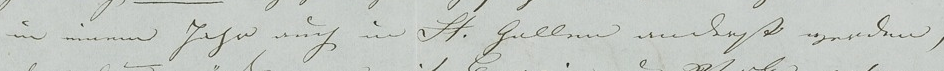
in einem Jahr auch in St. Gallen anderst werden,
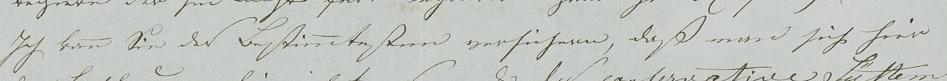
Ich kann Sie des Bestimmtesten versichern, daß man sich hier
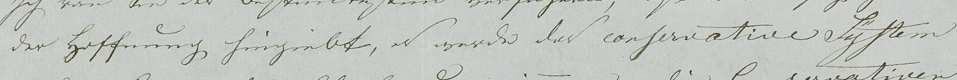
der Hoffnung hingiebt, es werde das conservative System
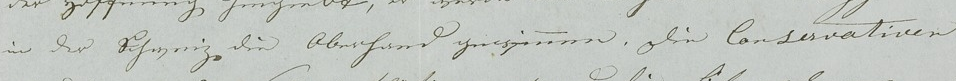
in der Schweiz die Oberhand gewinnen. Die Conservativen
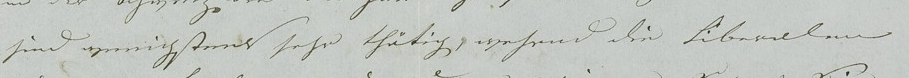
sind wenigstens sehr thätig, wehrnd die Liberalen
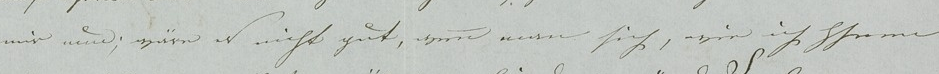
mir nun; wäre es nicht gut, wenn man sich, wie ich Ihnen
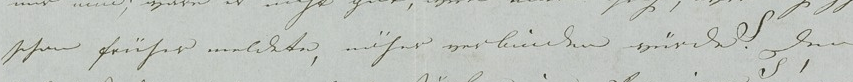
schon früher meldete, näher verbinden würde? Den
